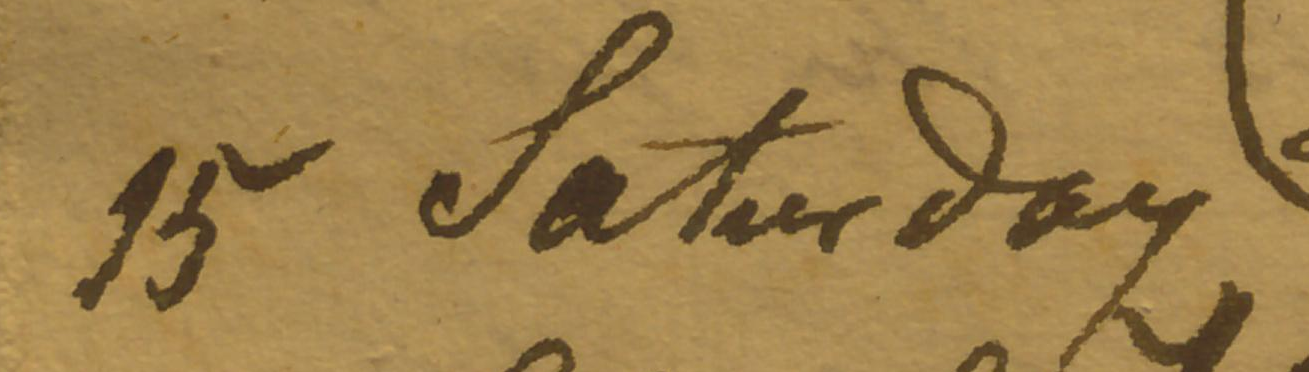15 Saturday
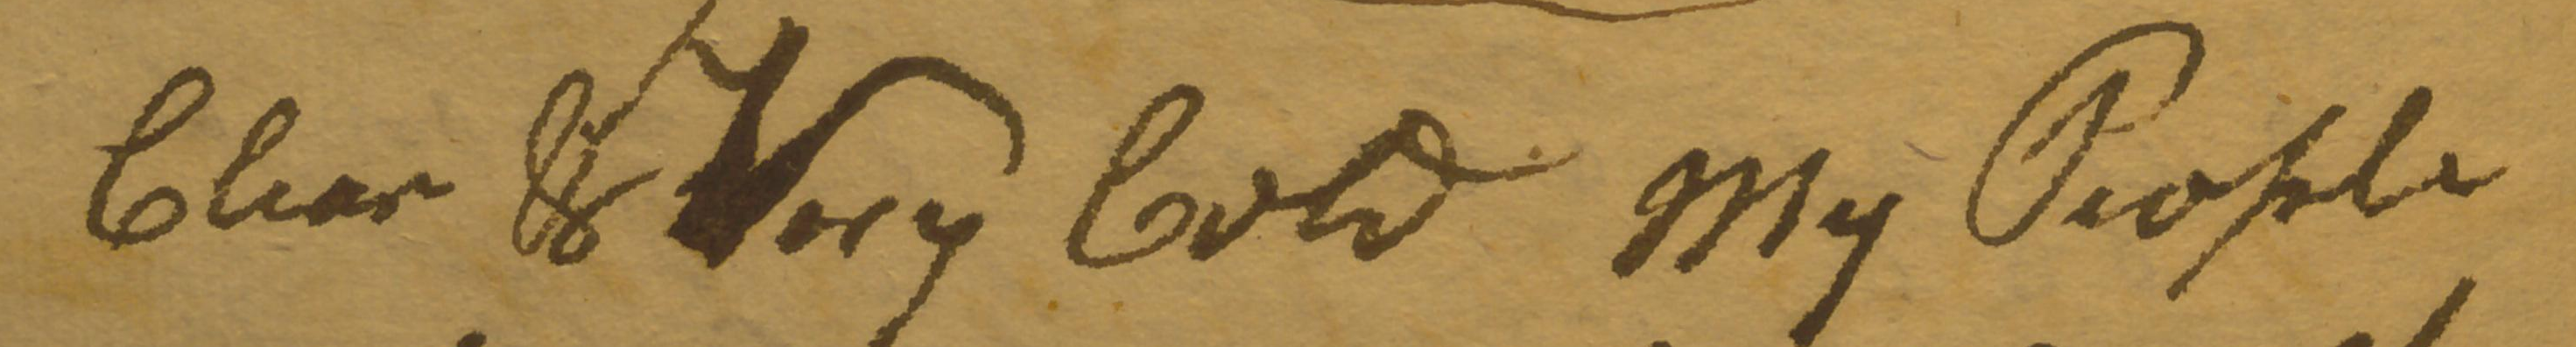Clear & Very Cold My People
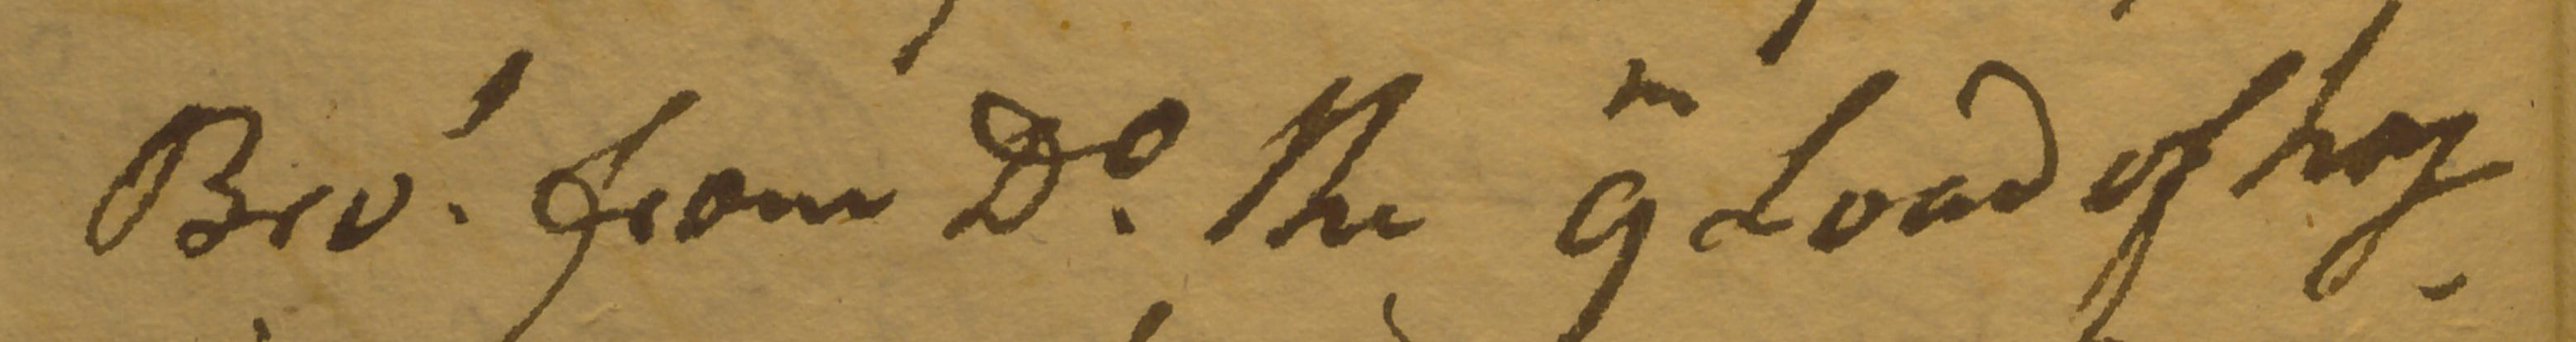Bro^t. from D^o. The 9^th Load of hay
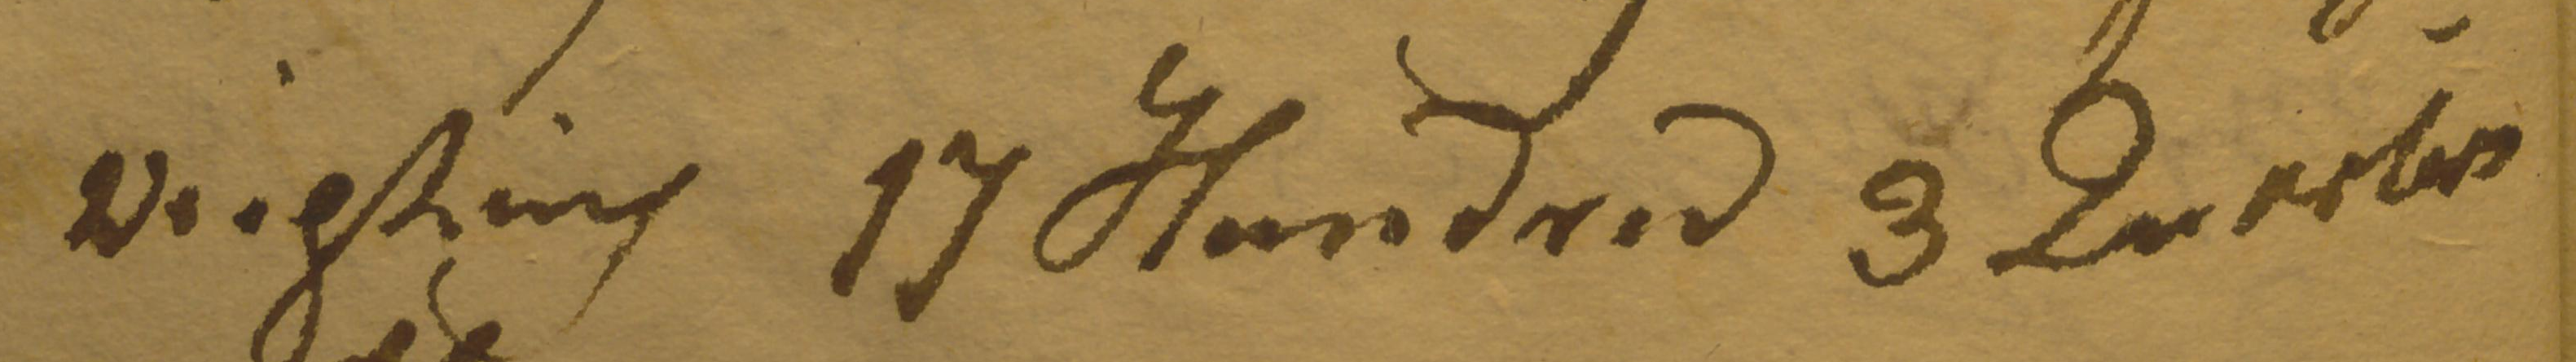weighing 17 Hundred 3 Quarters
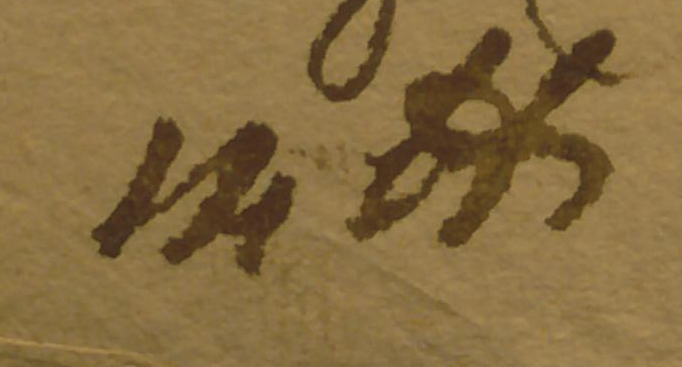14 lb
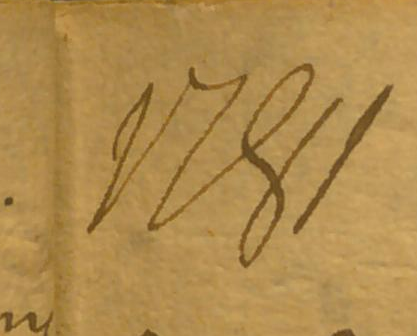1781
